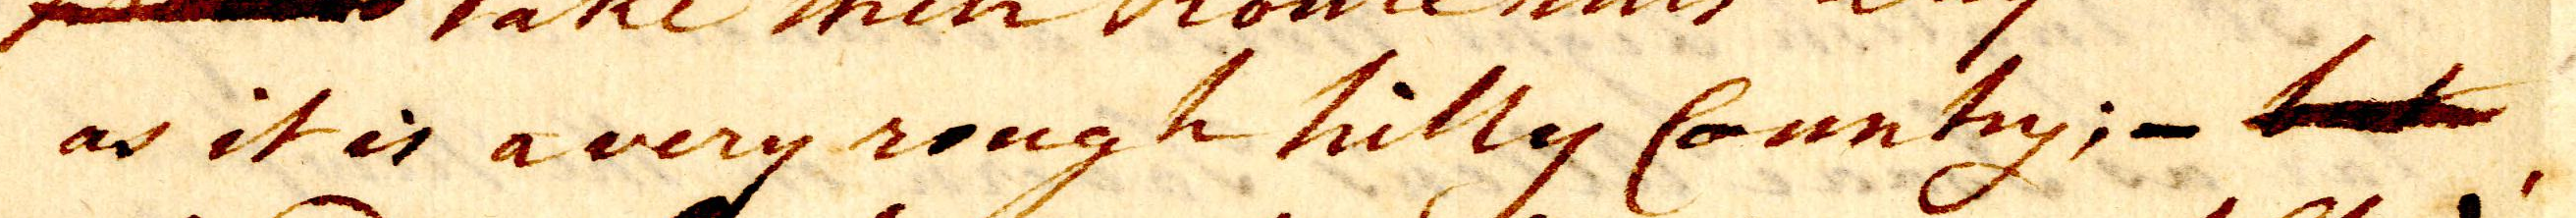as it is a very rough hilly Country;- [but]
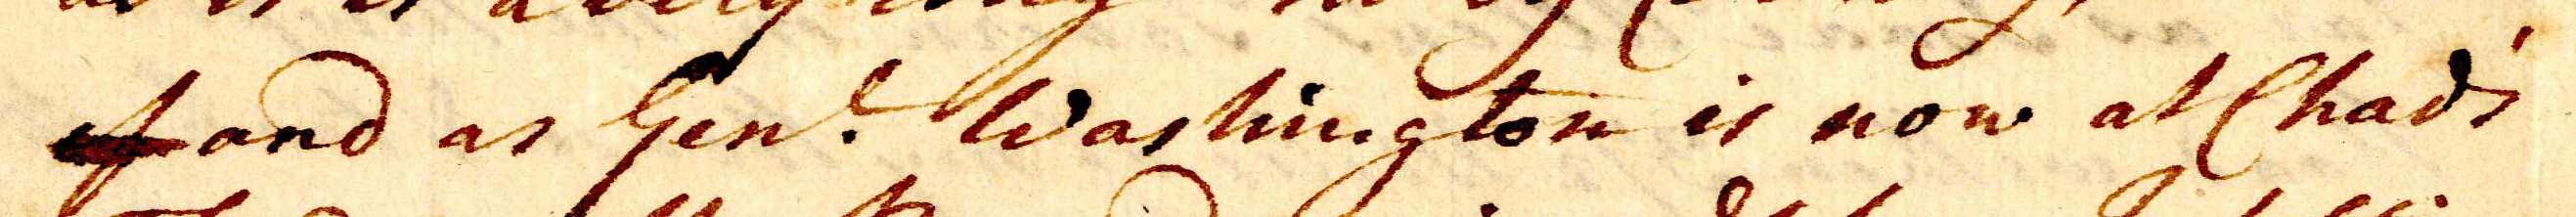[if] and as Gen^l. Washington is now at Chad's
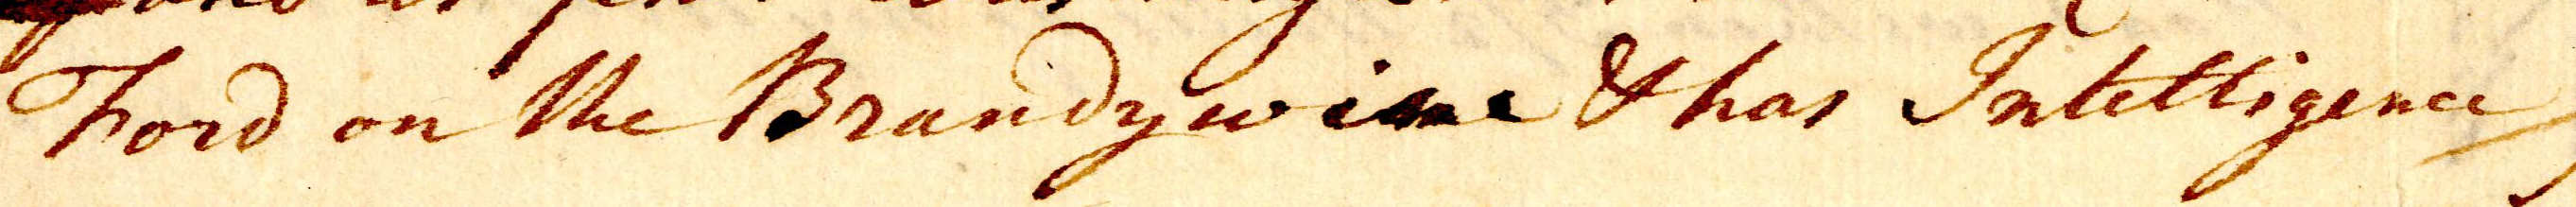Ford on the Brandywine & has Intelligence
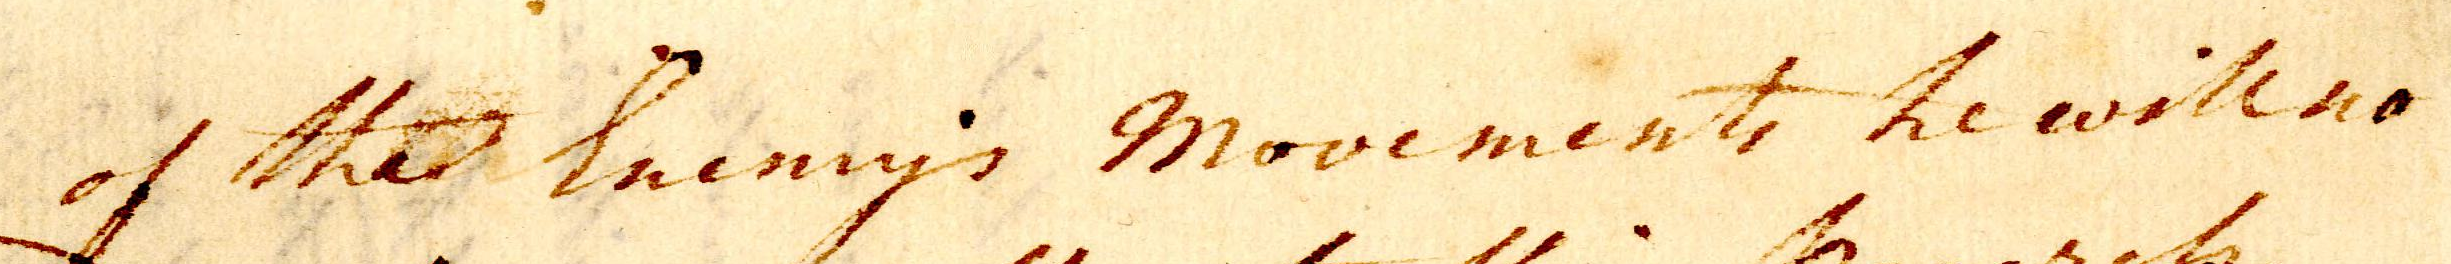of the Enemy's Movements he will no
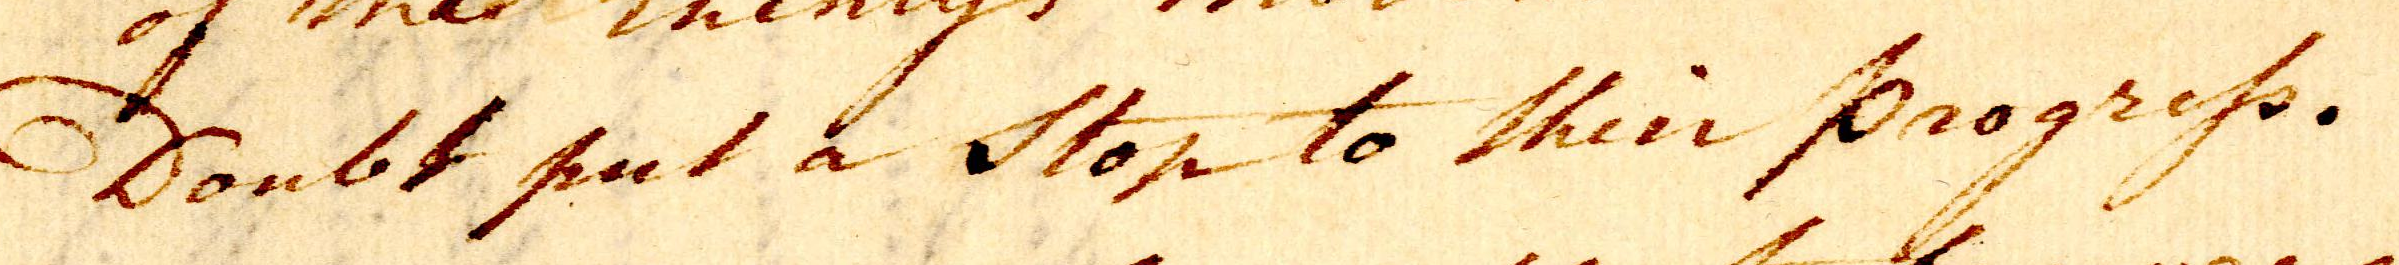Doubt put a stop to their progress.
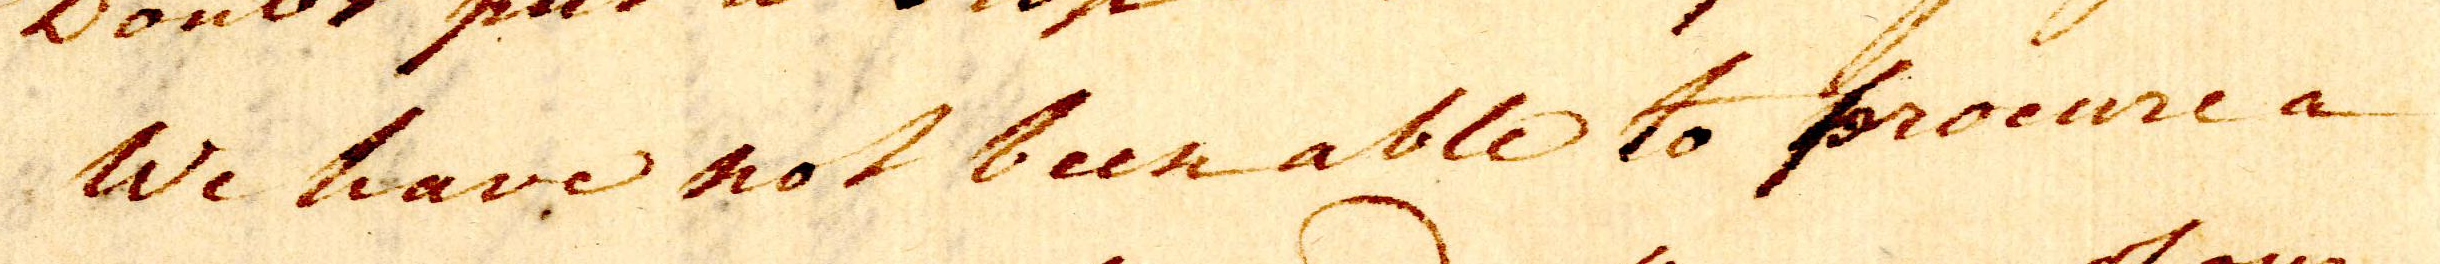We have not been able to procure a
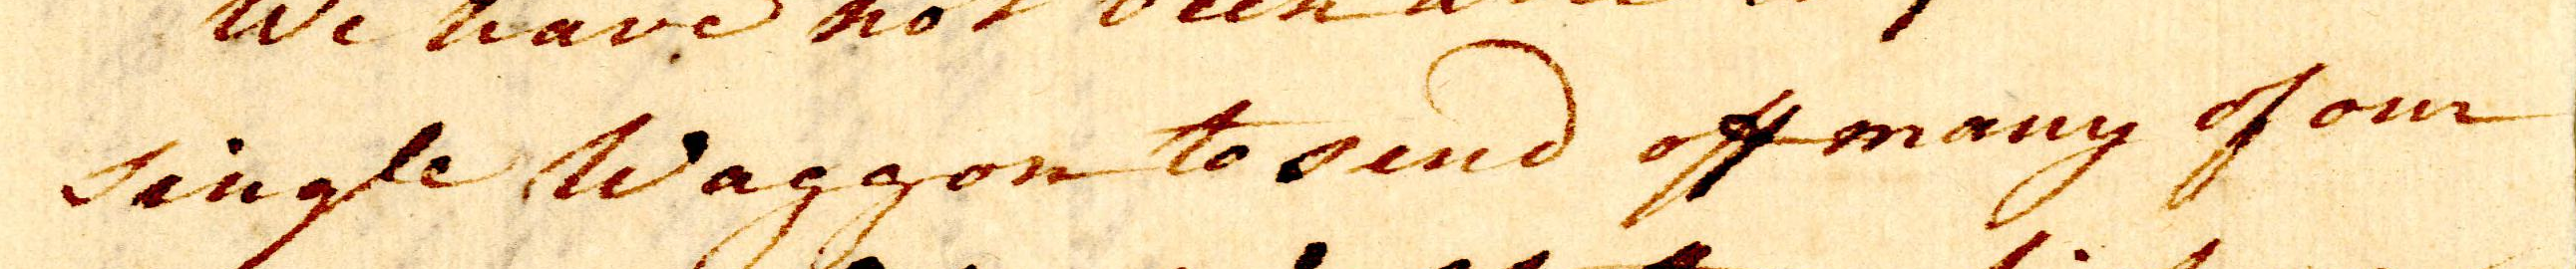single Waggon to send off many of our
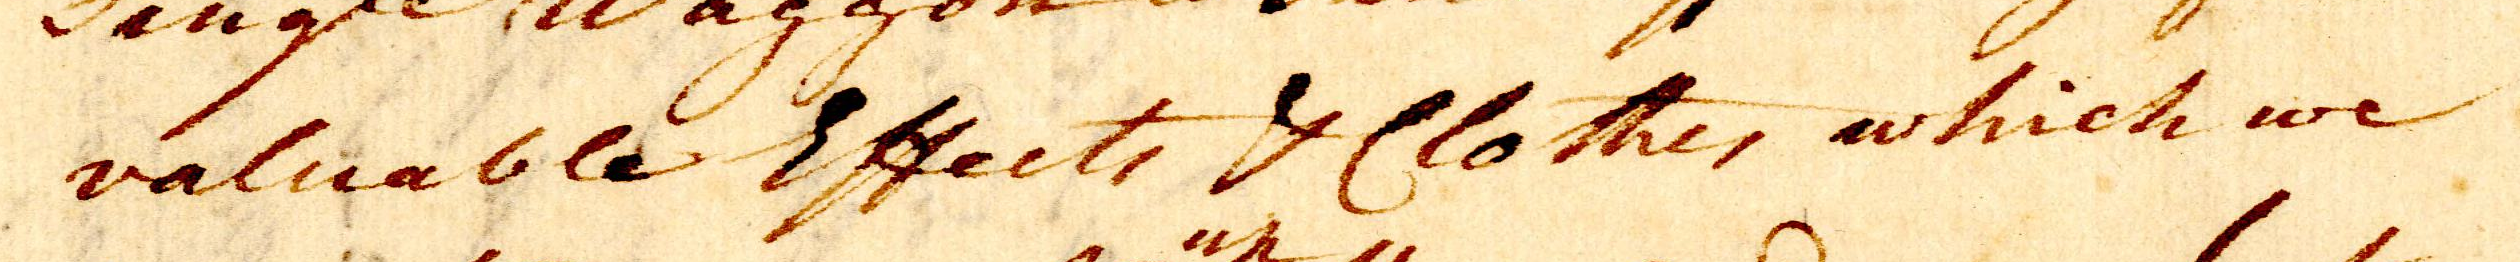valuable Effects & Clothes which we
